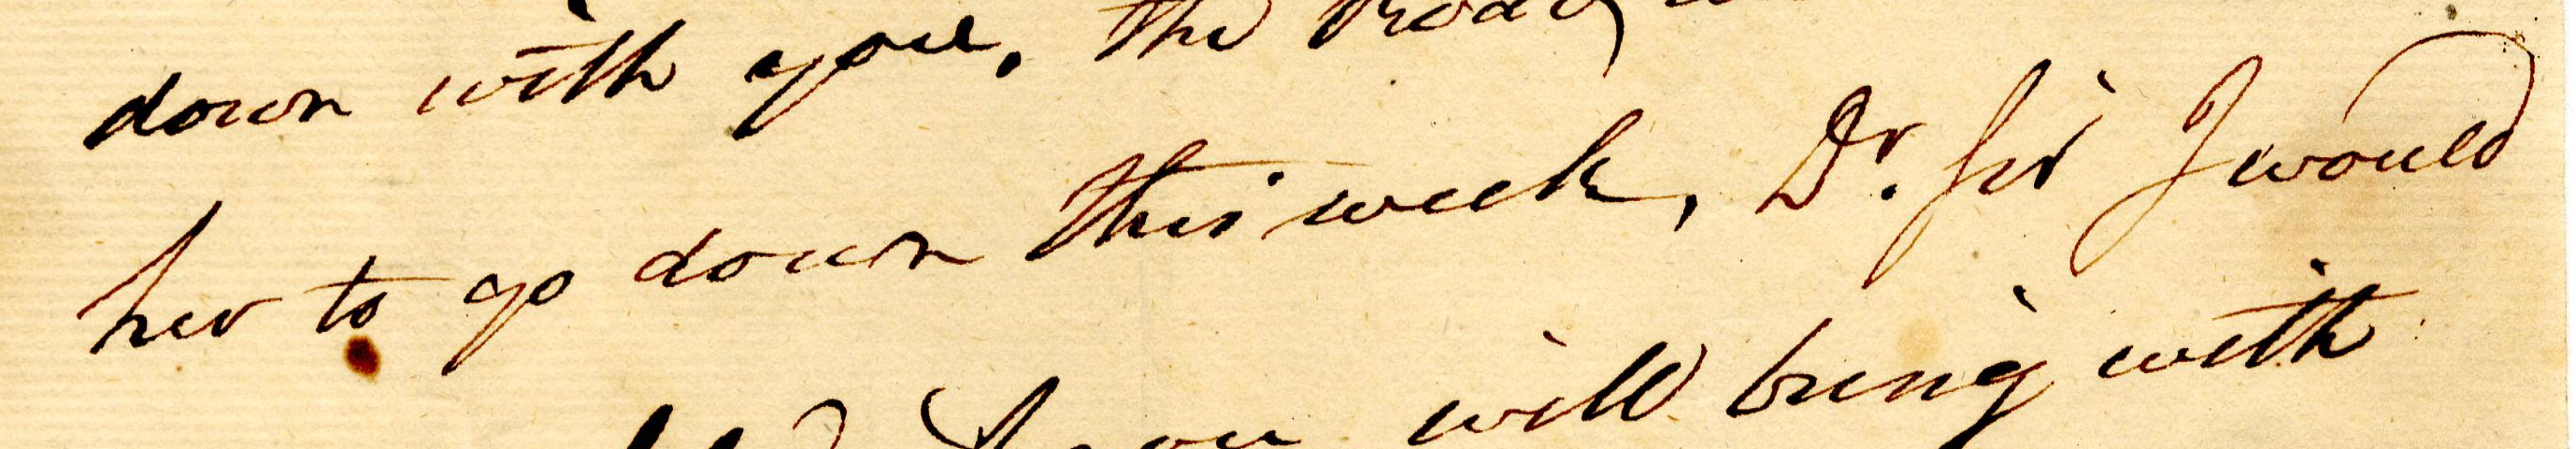her to go down this week, D^r. sir I would
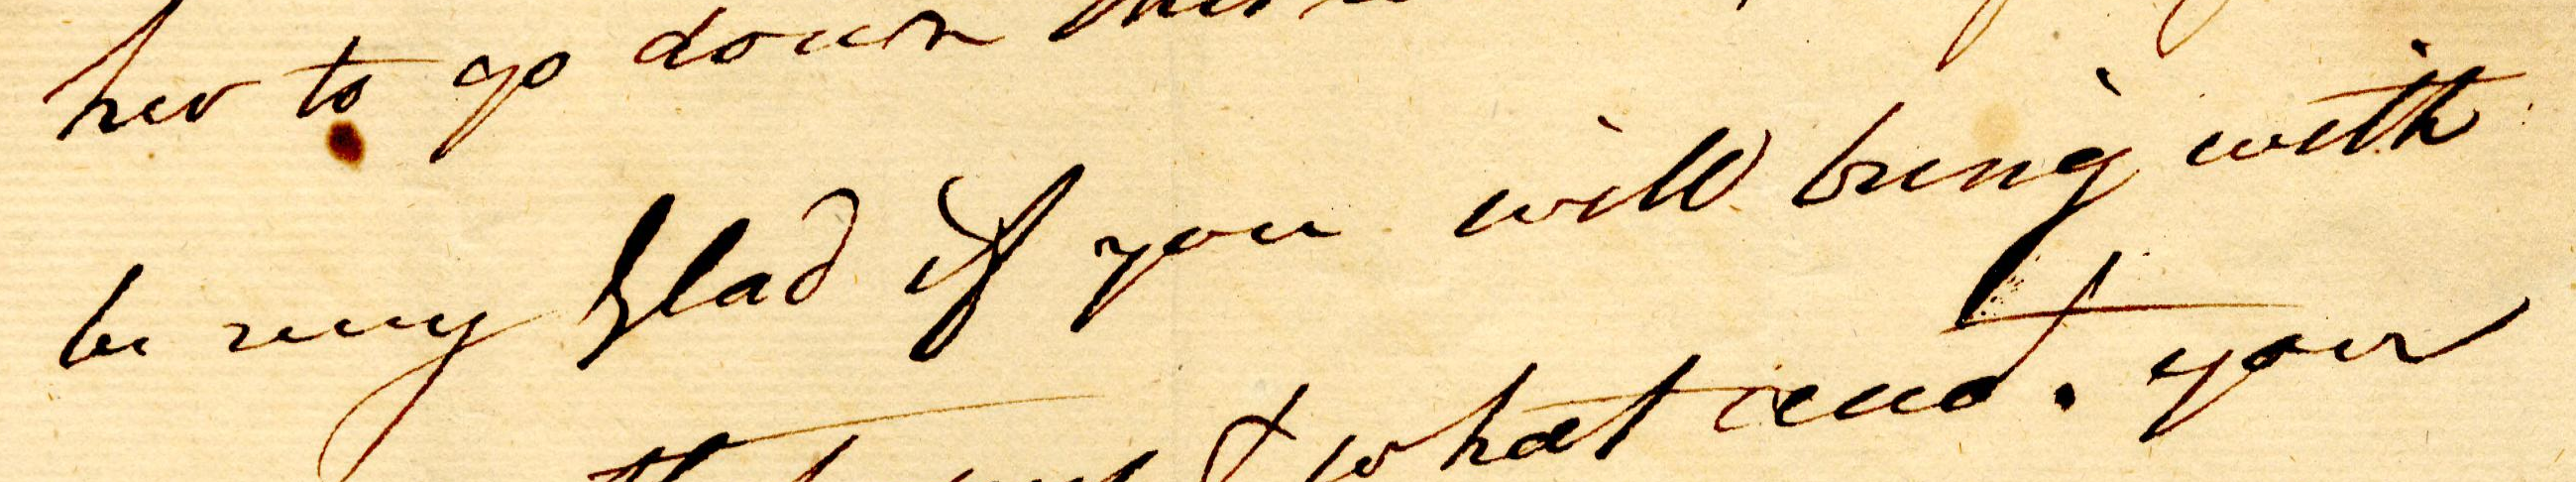be very glad if you will bring with
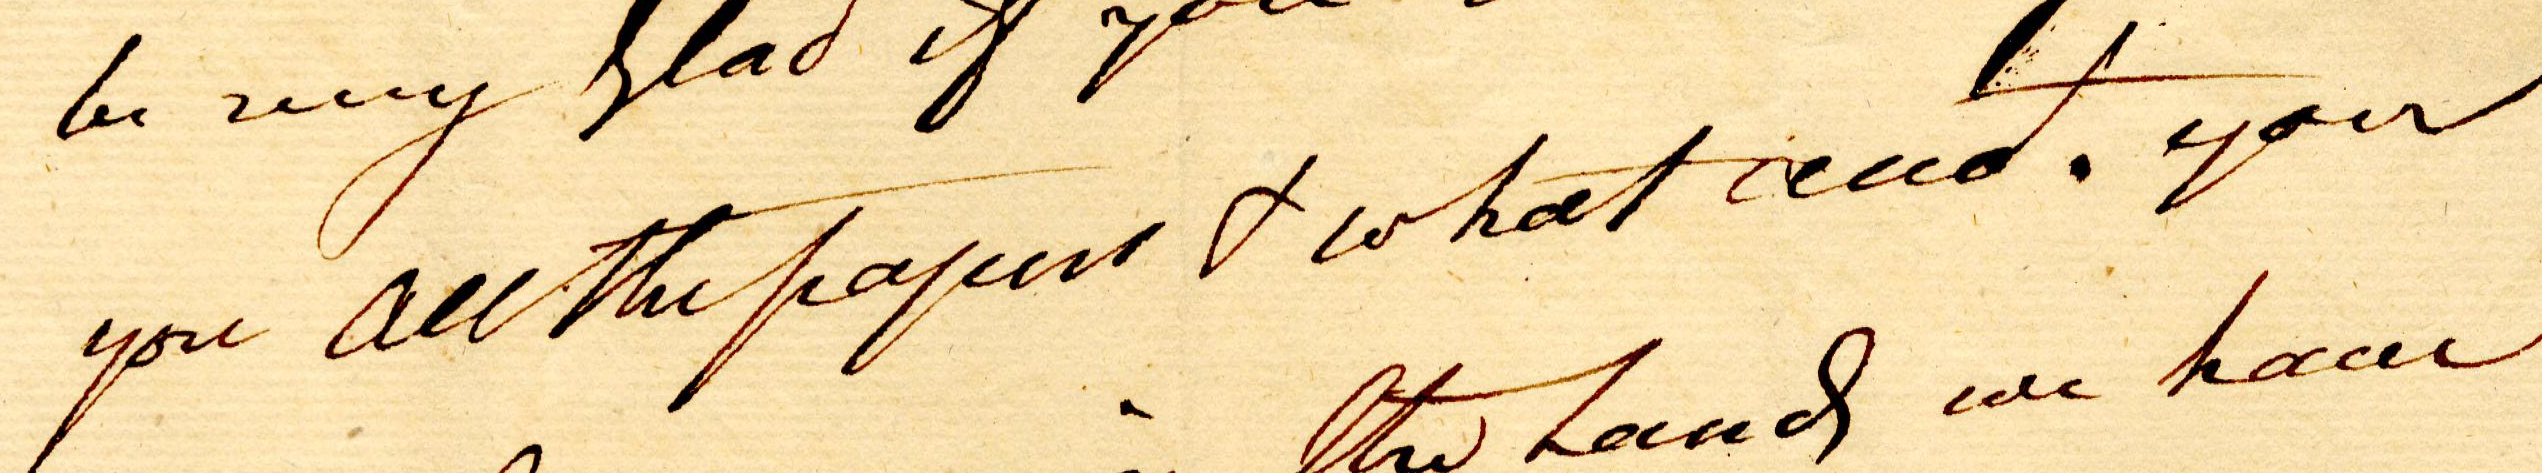you All the papers & what acco^t. you
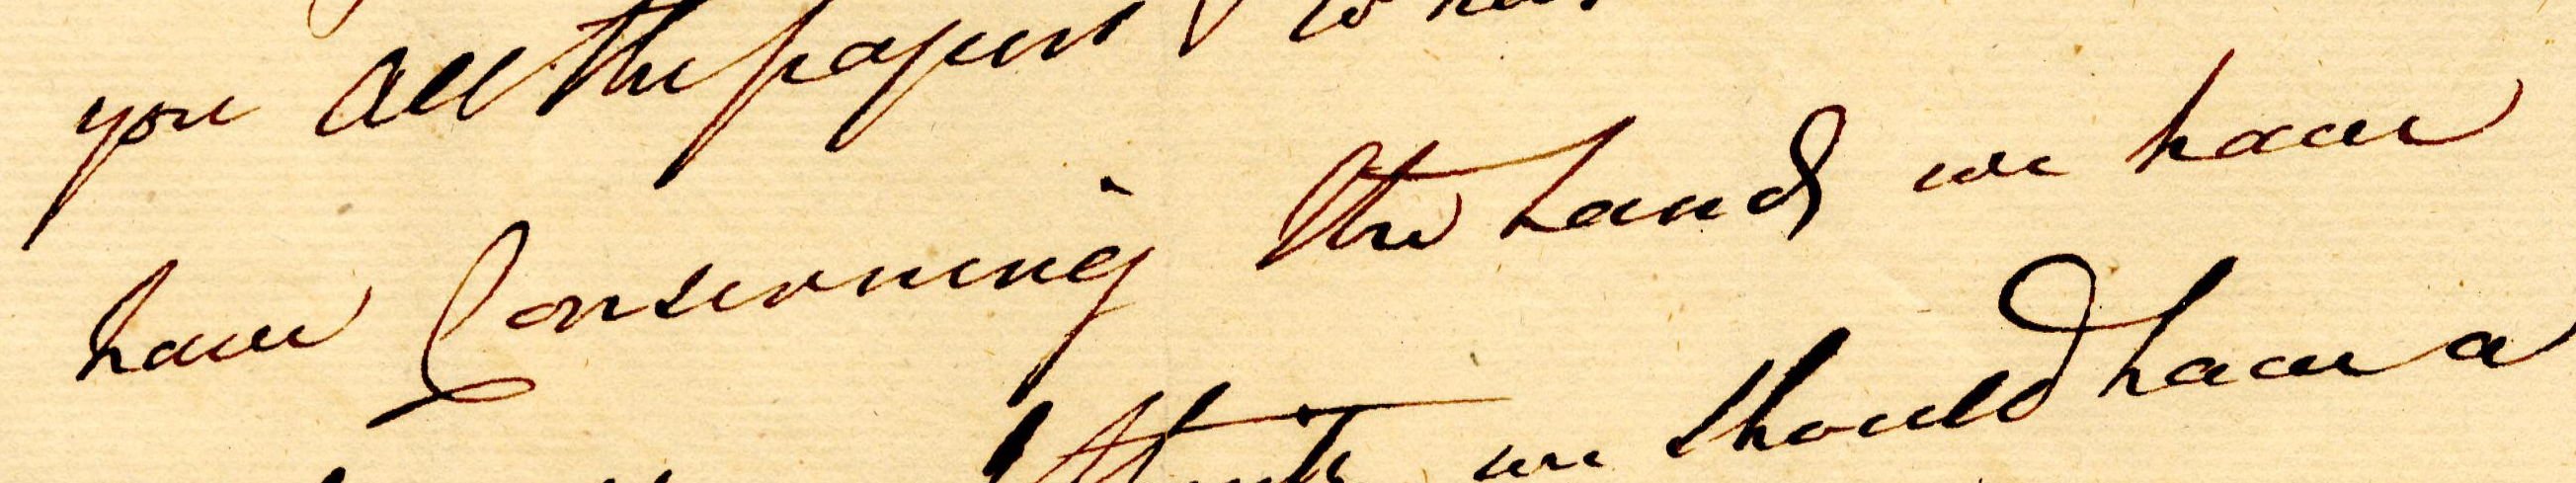have Conserning the Land we have
